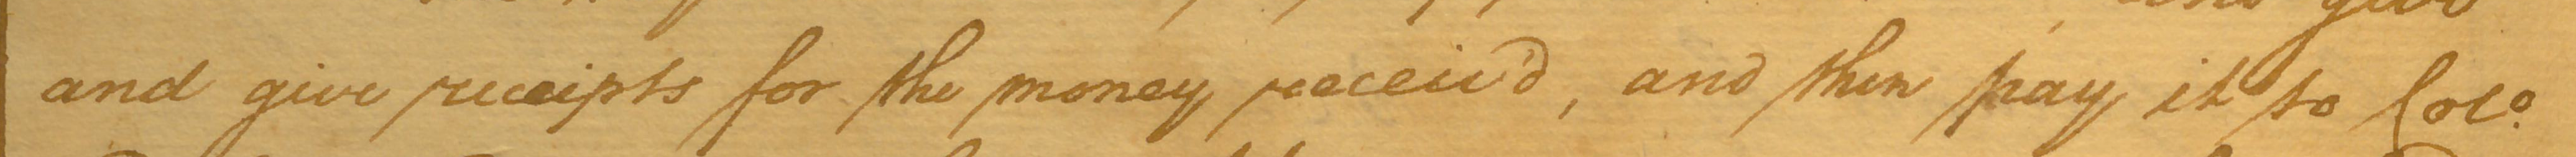and give receipts for the money receiv'd, and then pay it to Col^o.
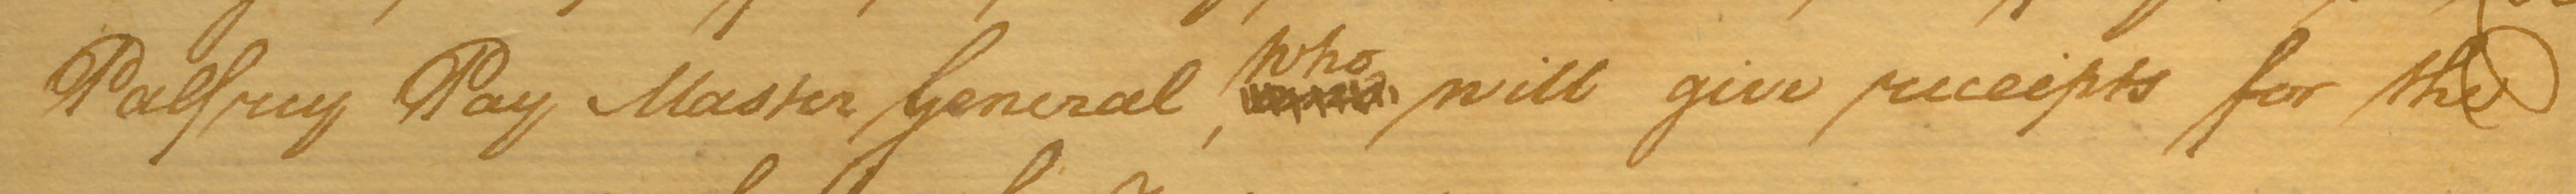Palfrey Pay Master General, who [___] will give receipts for the
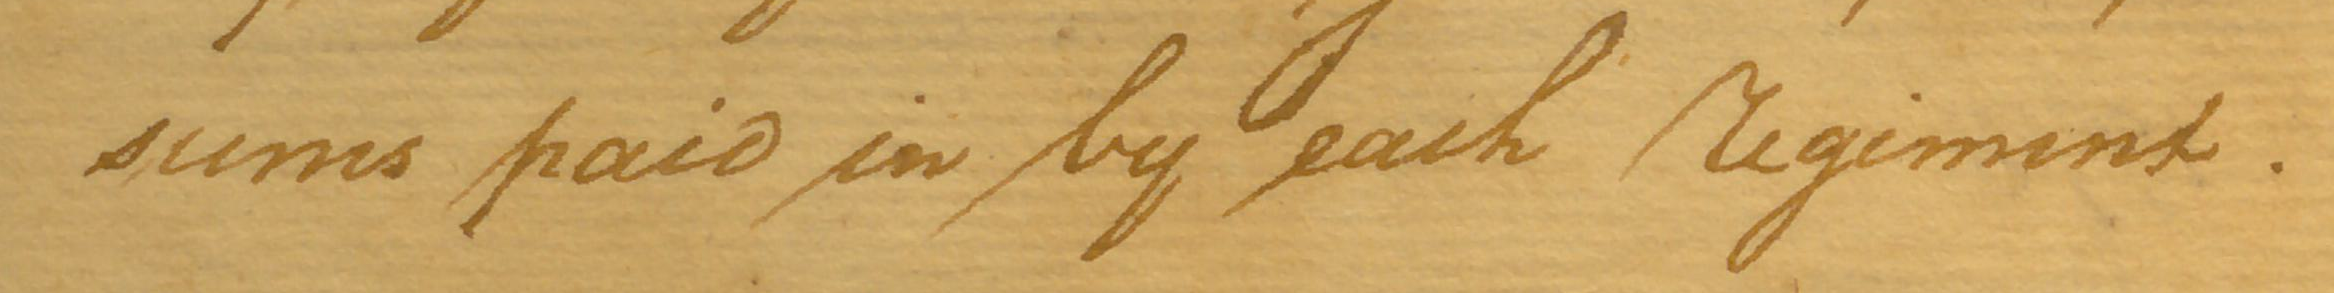sums paid in by each regiment.
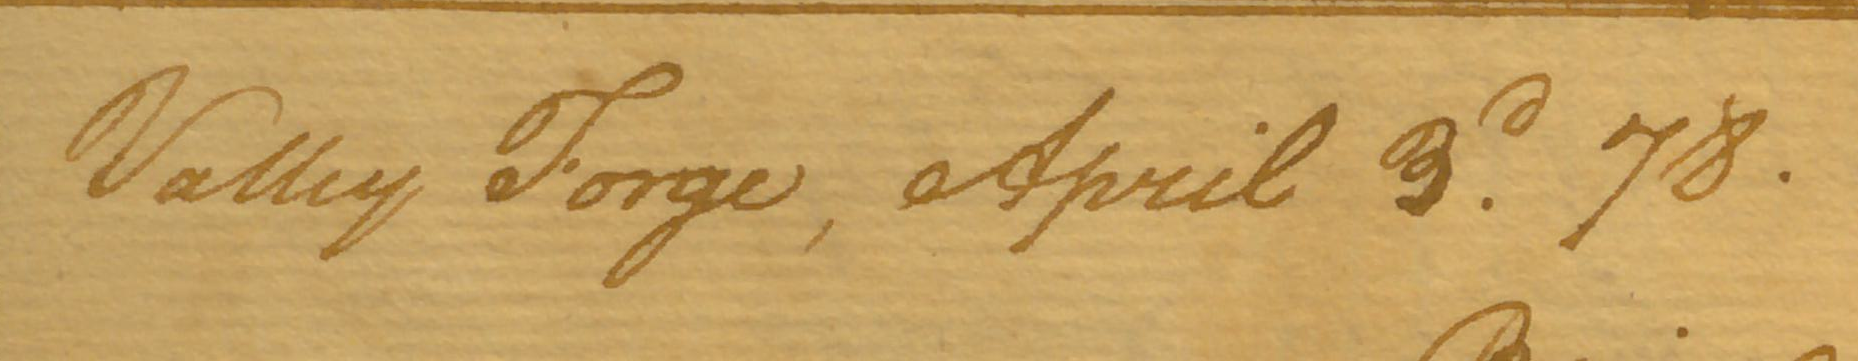Valley Forge, April 3^d. 78.
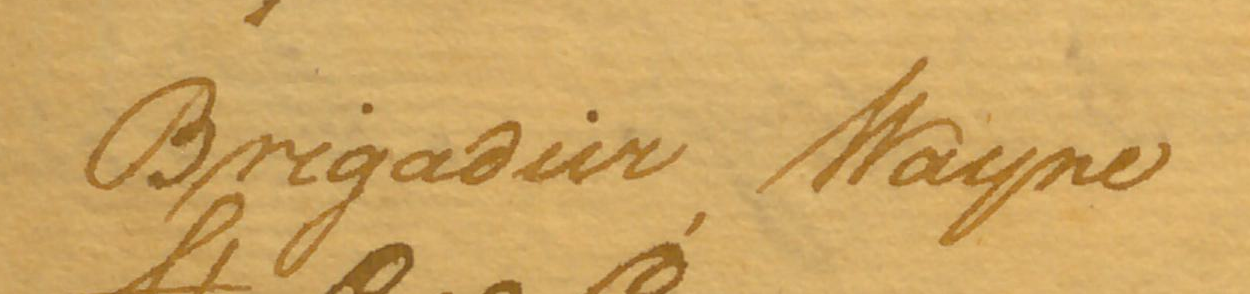Brigadier Wayne
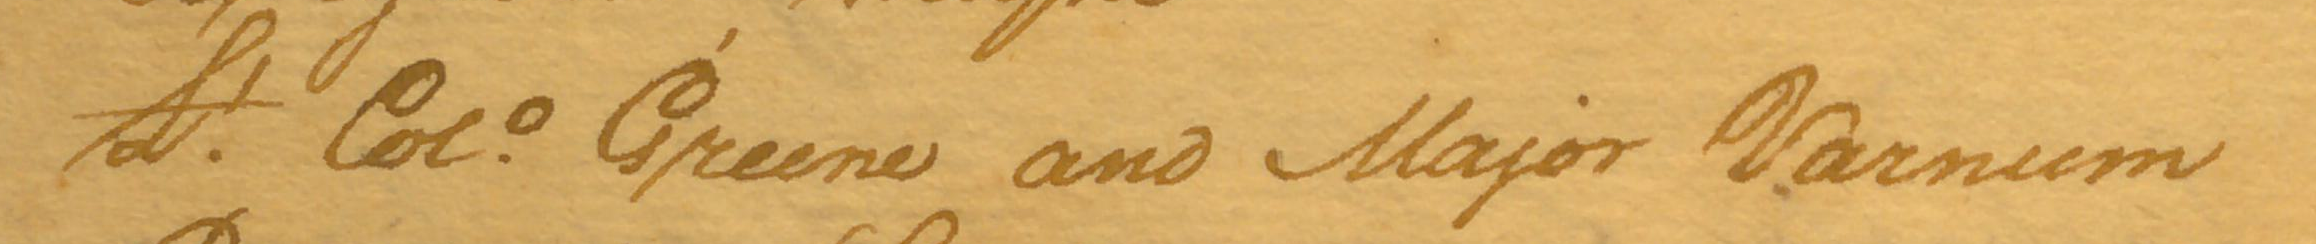L^t. Col^o. Greene and Major Varnum
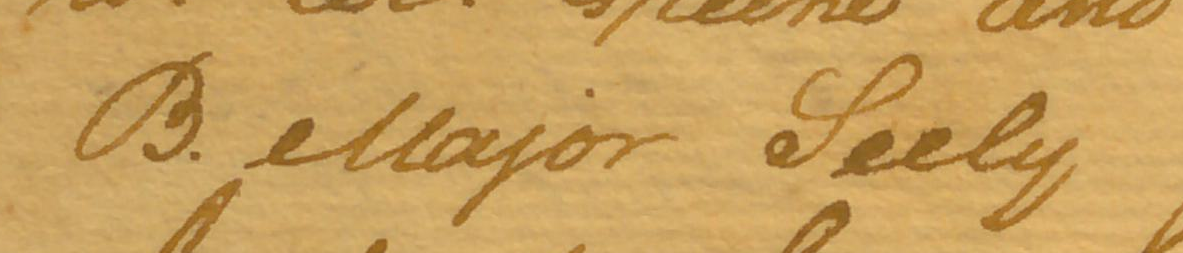B. Major Seely
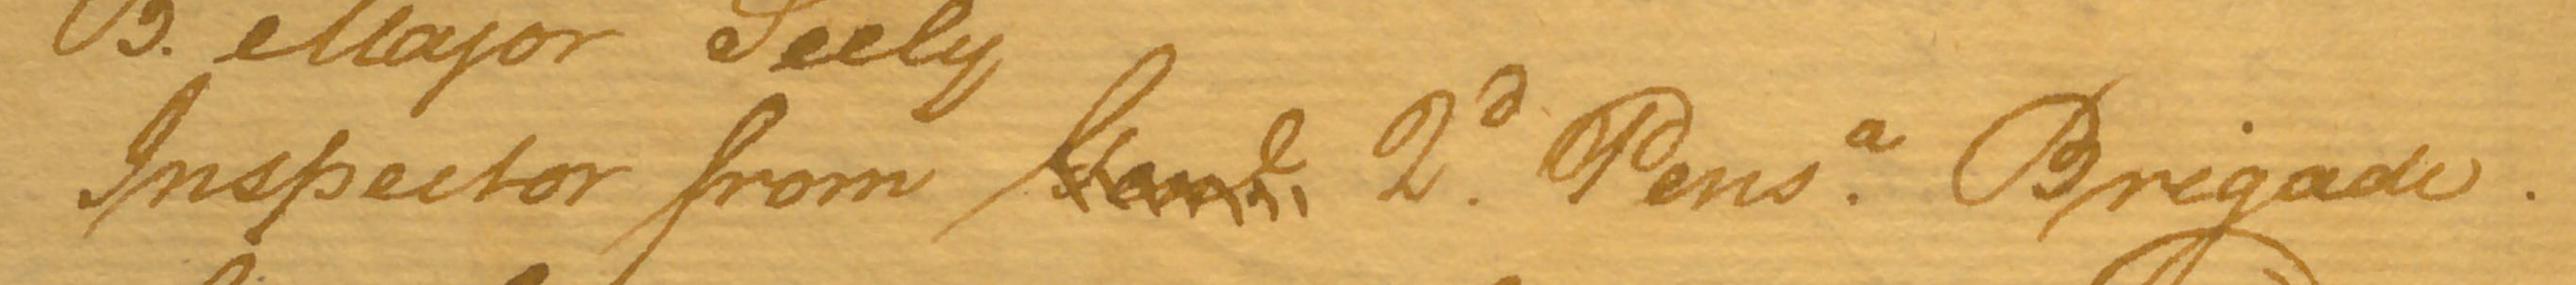Inspector from [Gen^l] 2^d. Pens^a. Brigade
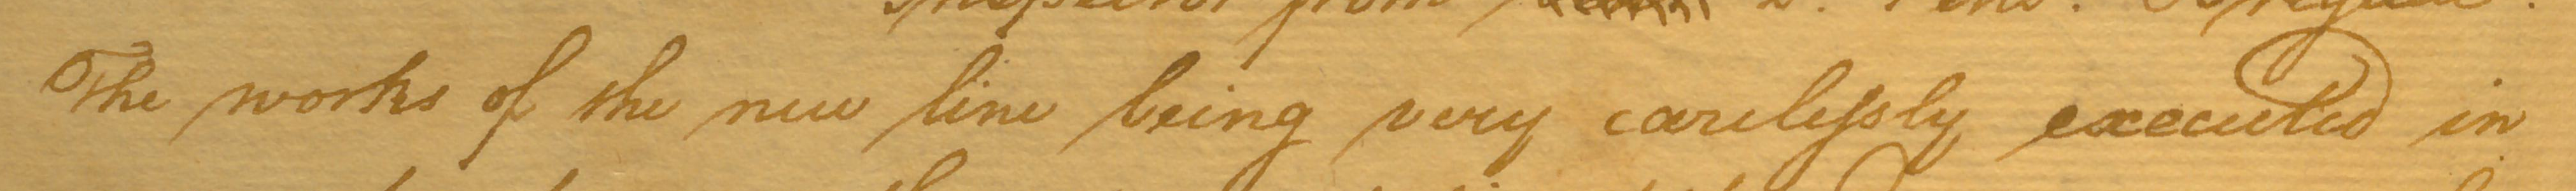The works of the new line being very carelessly executed in
